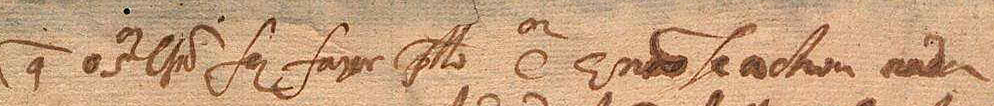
q̄ o sor bpō fez fazer p̅llo Cor E não se achou nada
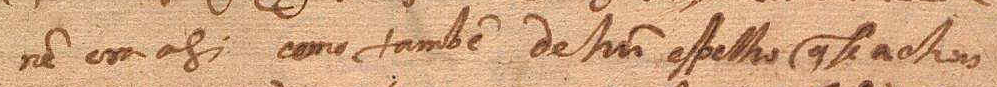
nē era asi como tambē de hū espelho q̄ se achou
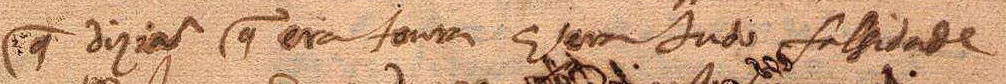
q̄ diziaõ q̄ era toura E era tudo falsidade
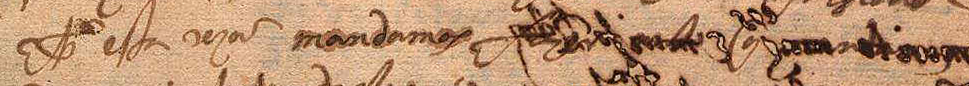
E p̄o esta rezā mandamos fazer auto q̄ mandamos
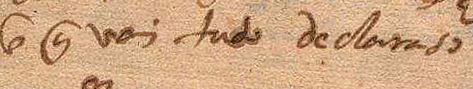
ē q̄ vai tudo declarado
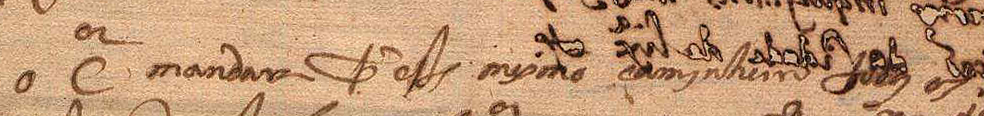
o Cor mandara p̄o estꝭ mesmo camjnheiro todos os
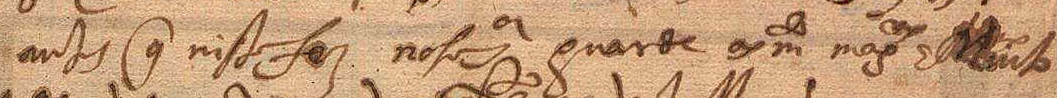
autos q̄ nisto fez noso sor guarde as mto magcas E Muito
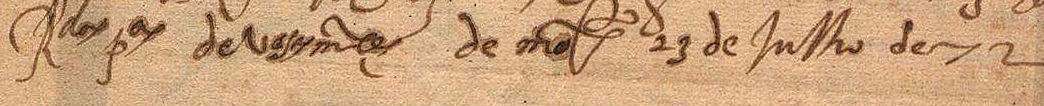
Rdas pas de vosas m̄ces de mōsto 23 de Julho de 72
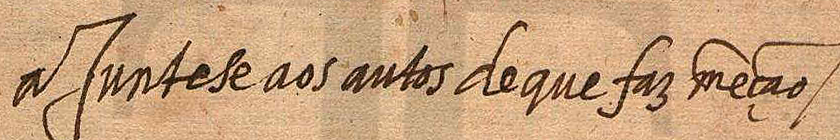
aJuntese aos autos de que faz mēção /
